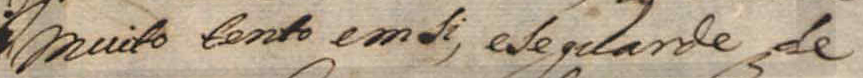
muito tento em si, e se guarde de
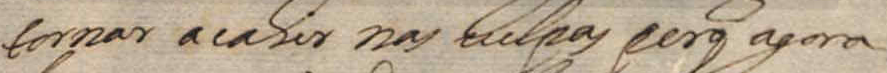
tornar a cahir nas culpas per q̄ agora
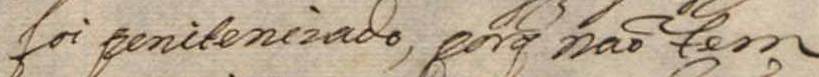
foi penitenciado, porq̄ não tem
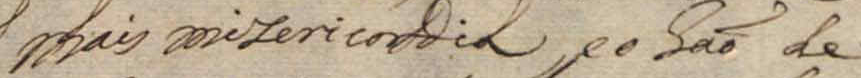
mais mizericordia, e o hão de
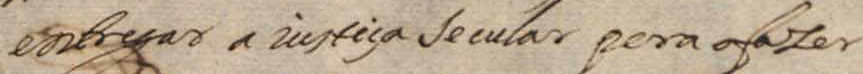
entregar a iustiça secular pera o fazer
